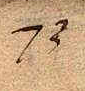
73
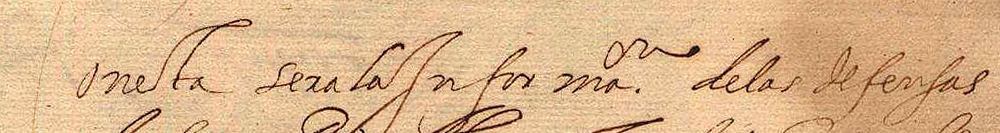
Con esta sera la Jnforma.on de las defensas
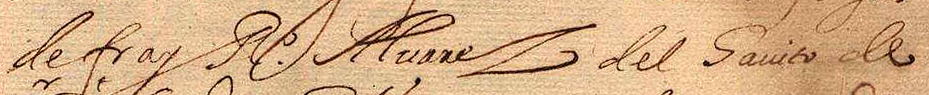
de fray R.o AluareZ del hauito de
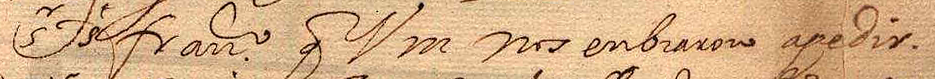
sr st fran.Co q̄ Vm nos enbiaron a pedir.
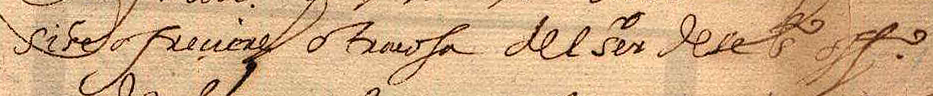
si se ofreciere otra cosa del sero dese sto off.o
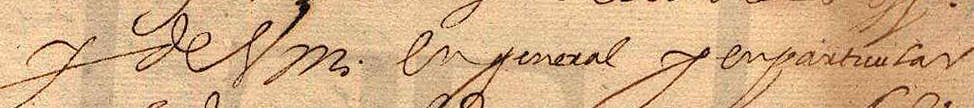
y de VM. en general y en particular
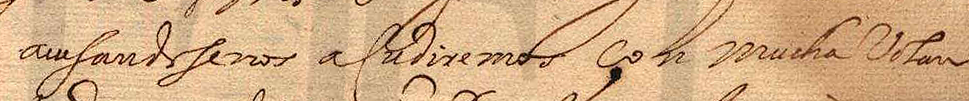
acusandosenos aCudiremos con mucha Volon
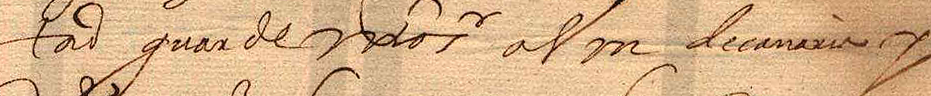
tad guarde nrō sr a Vm de canaria y
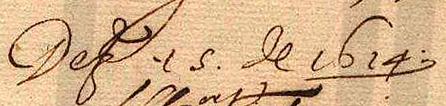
Dez.o 15. de 1614.
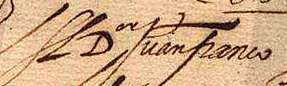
Dor Juan Franco
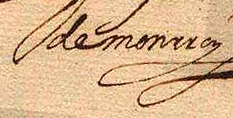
de monrrey
